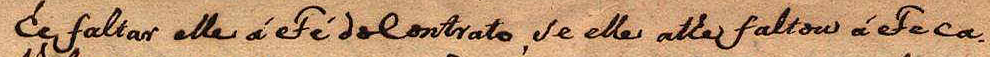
he faltar elle á Fé do Contrato, se elle athe faltou á Fe ca
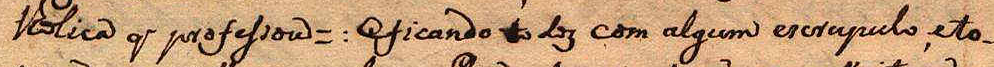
tholica q̄ professou =: E ficando todos com algum escrupulo, e to
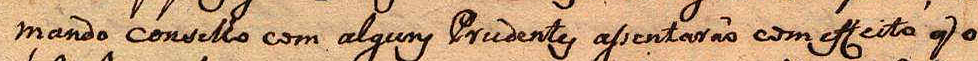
mando conselho com alguns Prudentes assentaraõ com effeito q̄ o
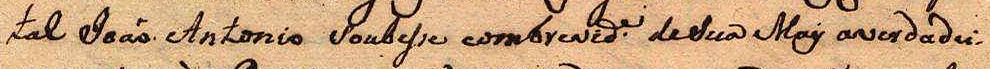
tal Ioaõ Antonio soubesse com brevid.e de Sua May a verdadei
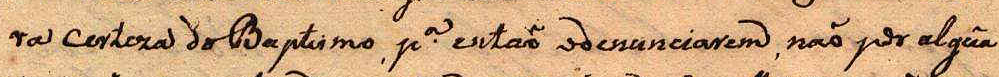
ra certeza do Baptismo, p.a entaõ o denunciarem, naõ por algūa
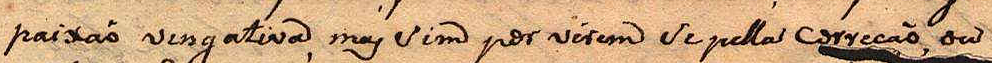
paixaõ vingativa, mas sim por verem se pella correçaõ ou
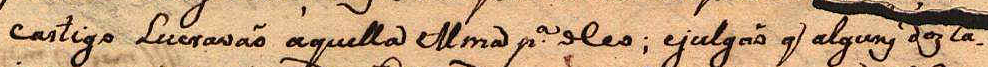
castigo Lucravaõ aquella Alma p.a o Ceo; e julgaõ q̄ alguns dos ta
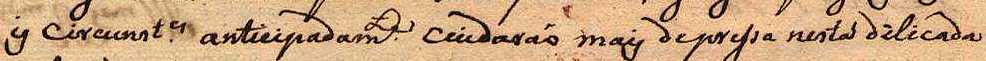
is circunst.es antecipadam.te cuidaraõ mais depressa nesta delicada
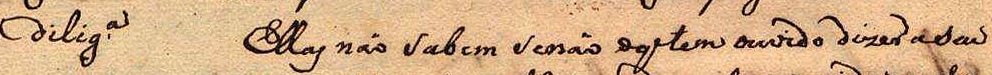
dilig.a Ellas não sabem senaõ o q̄ tem ouvido dizer a seu
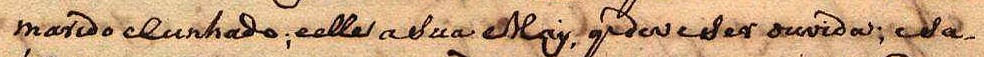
marido e Cunhado; e elle a Sua May, q̄ deve ser ouvida; e sa
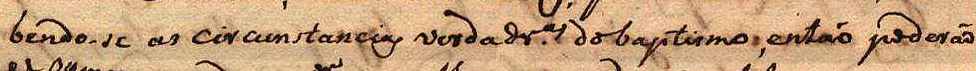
bendo-se as circunstancias verdadr.as do baptismo, entaõ poderaõ
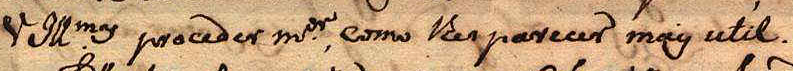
V Ill.mas proceder m.or, como lhes parecer mais util.
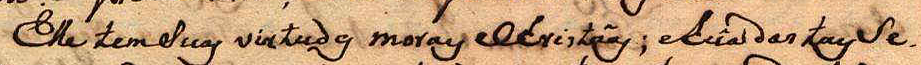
Elle tem suas virtudes moraes e Christaãs; e huā das taes se
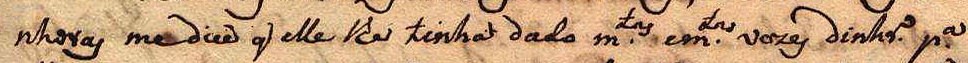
nhoras me dice q̄ elle lhe tinha dado m.tas e m.tas vezes dinhr.o p.a
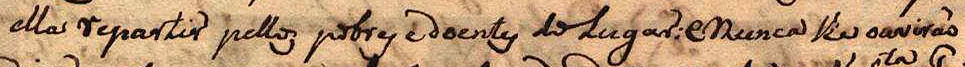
ella repartir pellos pobres e doentes do Lugar: e Nunca lhe ouviraõ
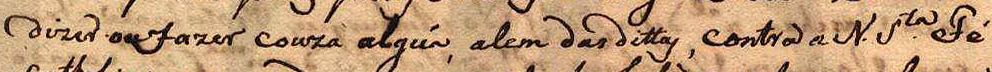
dizer ou fazer couza alguā, alem das dittas contra a N. S.ta Fé
